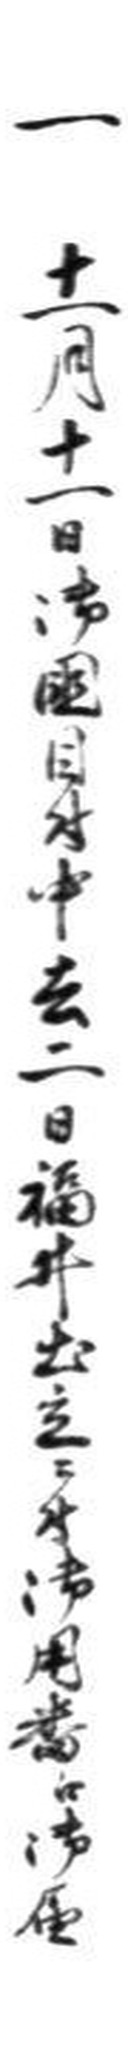一十一月十一日御国目付中去二日福井出立ニ付御用番江御届
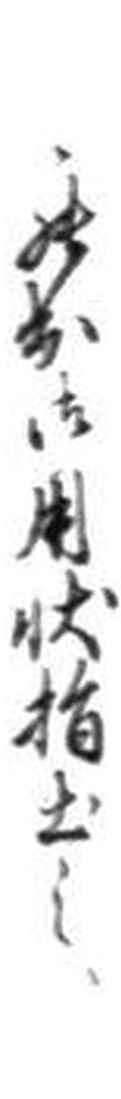罷出御用状指出之
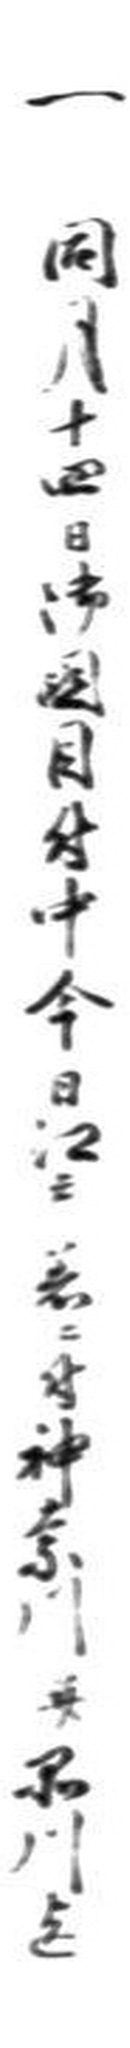一同月十四日御国目付中今日江戸着ニ付神奈川幷品川迄
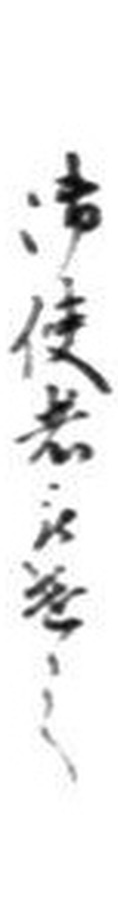御使者被遣之
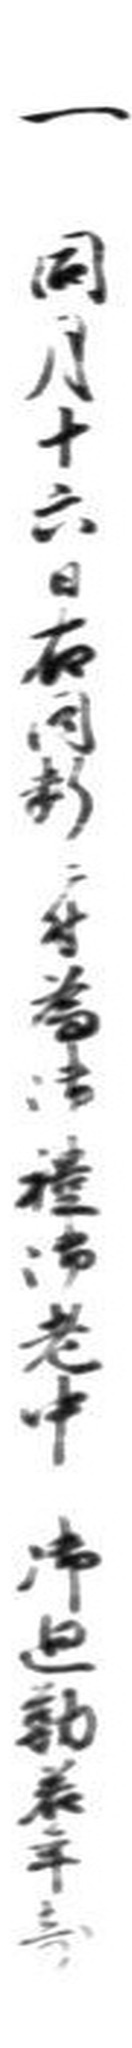一同月十六日右同断ニ付為御礼御老中御廻勤若年寄
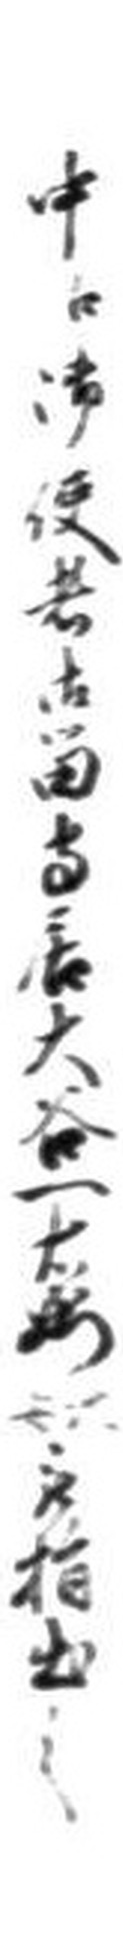中江御使者御留守居大谷一右衛門次安被指出之
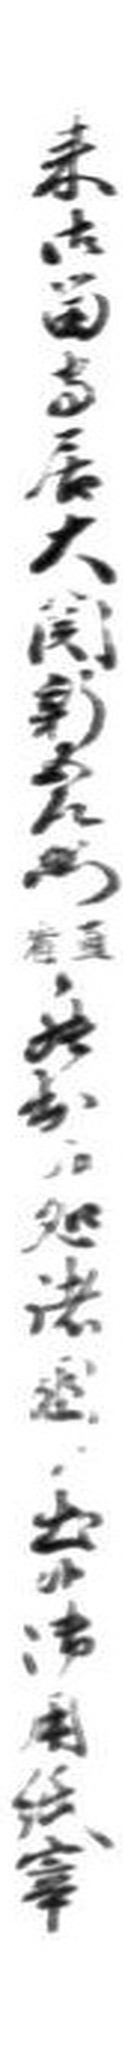来御留守居大関新五左衛門直看罷出候処諸国ゟ出候御用紙宰
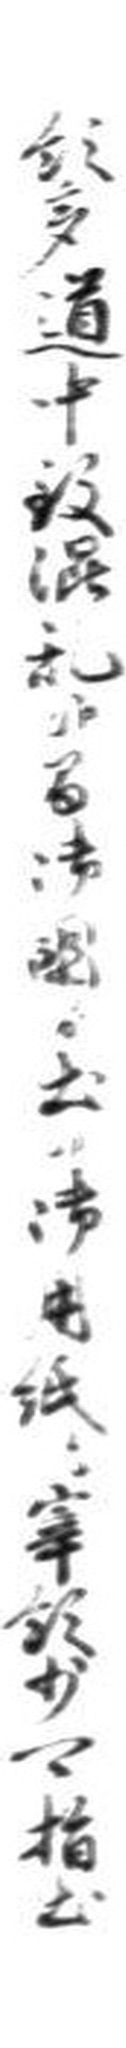領多道中致混乱候間御国ゟ出候御用紙も宰領少可指出
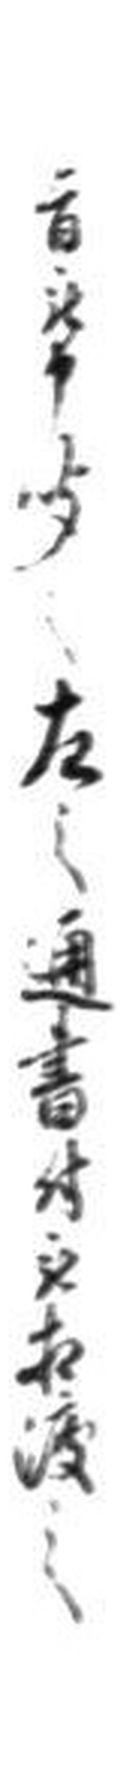旨被申聞之左之通書付被相渡之

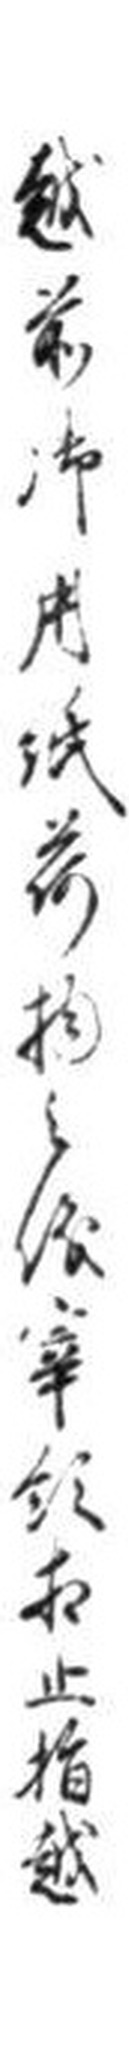越前御用紙荷物之儀宰領相止指越
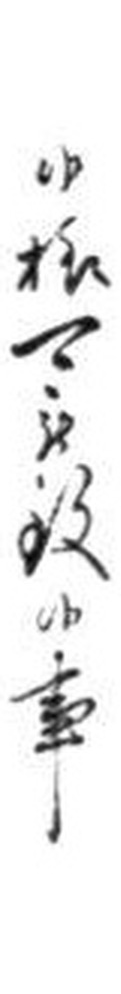候様可被致候事
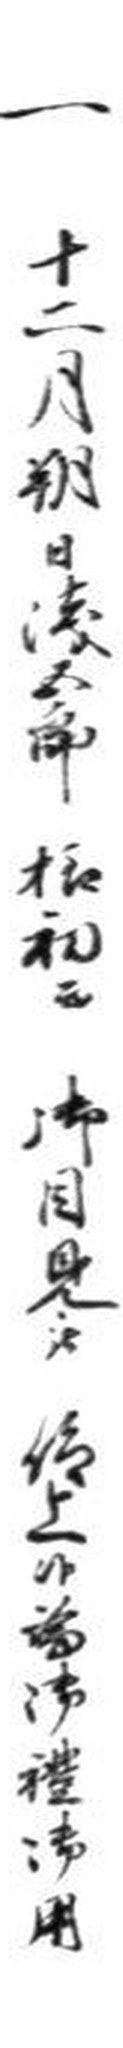一十二月朔日浅五郎様初而御目見被仰上候為御礼御用
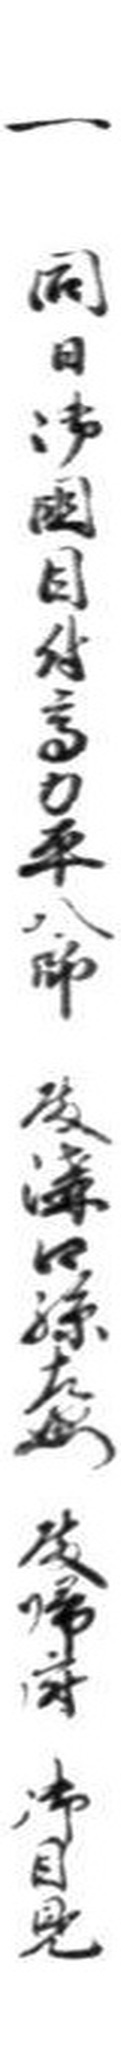一同日御国目付高力平八郎殿溝口孫左衛門殿帰府御目見
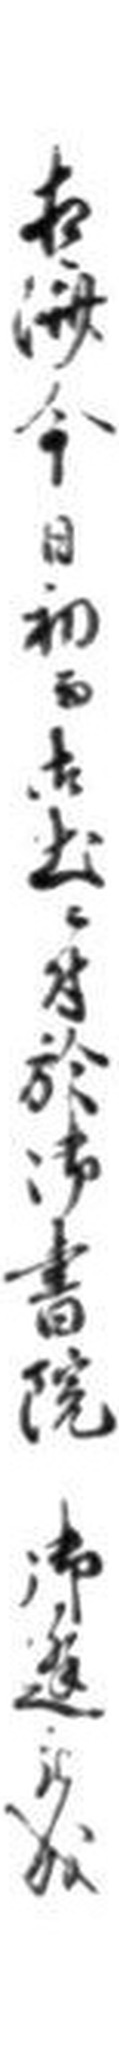相済今日初而御出ニ付於御書院御逢被成
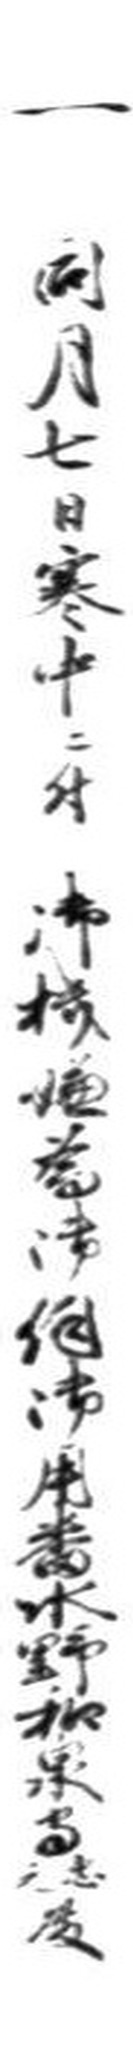一同月七日寒中ニ付御機嫌為御伺御用番水野和泉守忠之殿
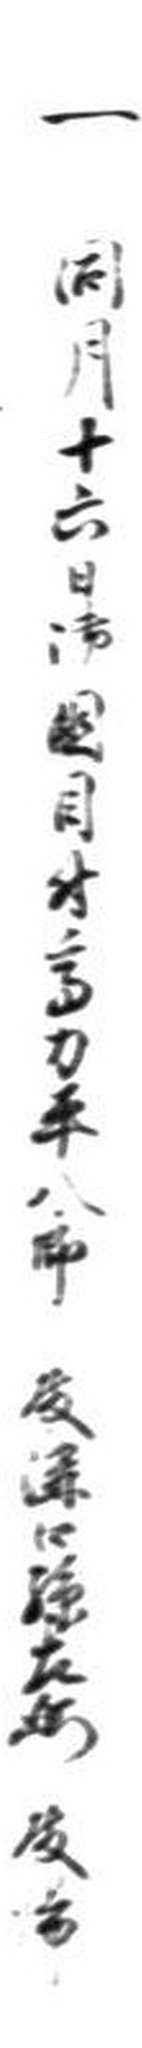一同月十六日御国目付高力平八郎殿溝口孫左衛門殿帰
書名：家譜 三十九 宗矩公 享保十年
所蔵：福井県文書館 Fukui Prefectural Archives
